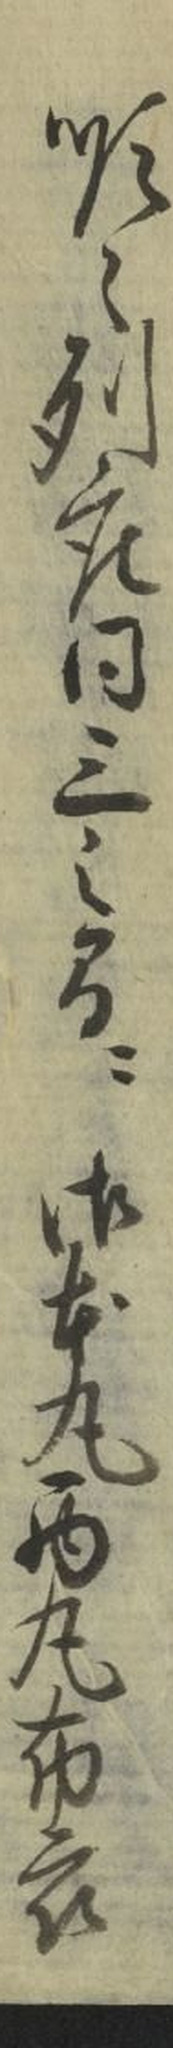順々列座同三之間に御本丸西丸布衣
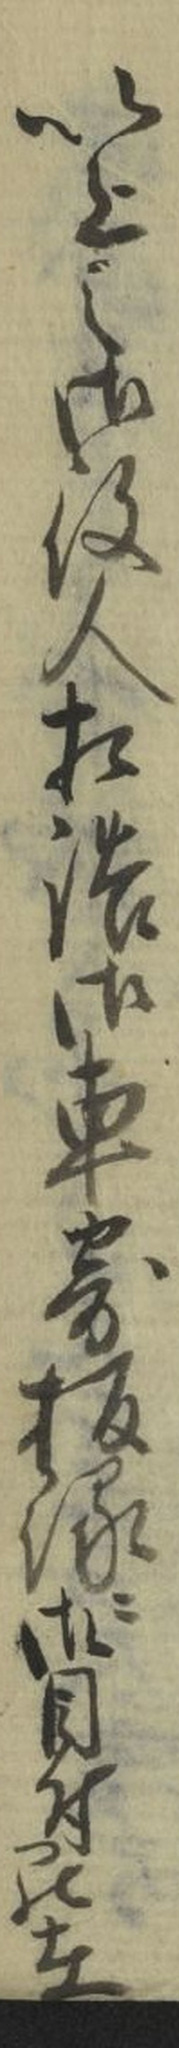以上之御役人相詰御車寄板縁に御目付罷在

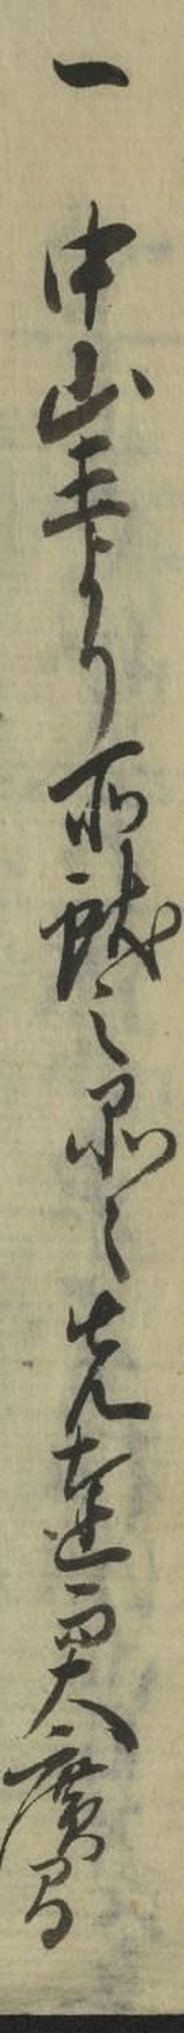一中山王より所献之品々先達て大広間
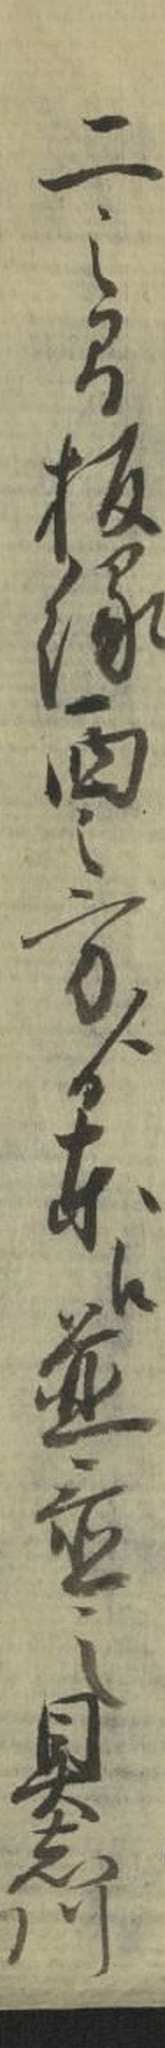二之間板縁西之方ゟ東え並置之具志川
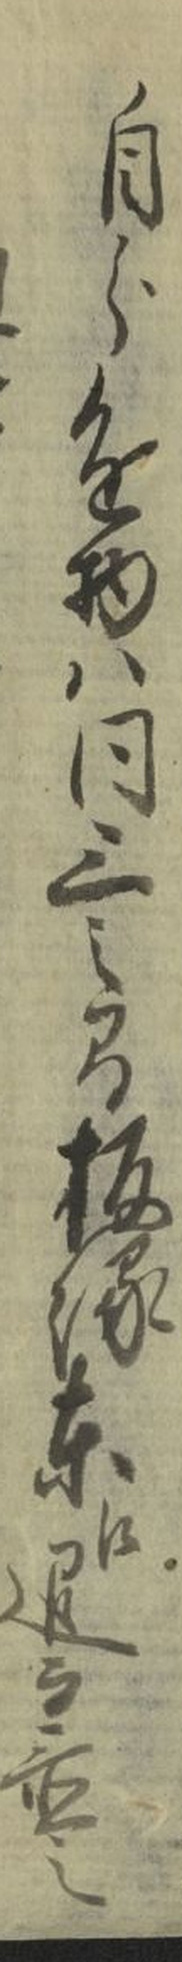自分進物は同三之間板縁東え退て置之
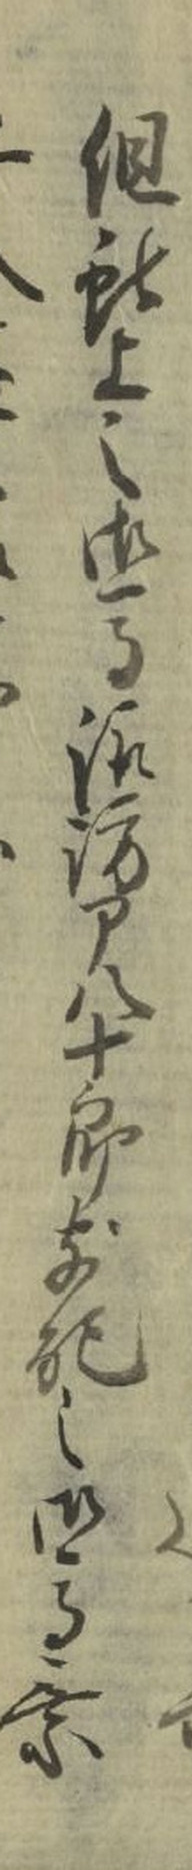但献上之御馬諏訪部八十郎支配之御馬乗
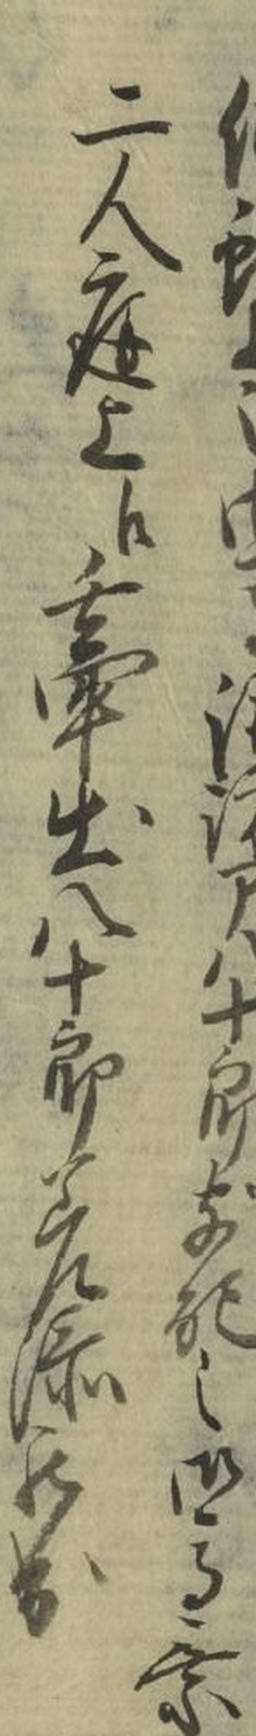二人庭上え牽出八十郎差添罷出
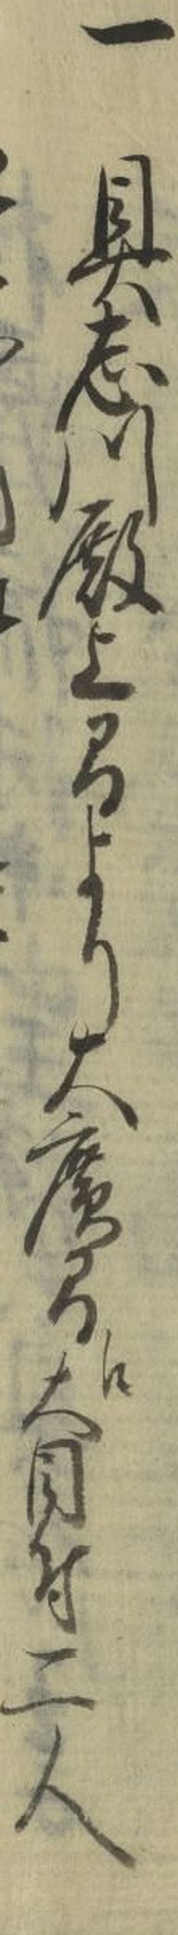一具志川殿上間より大広間え大目付二人
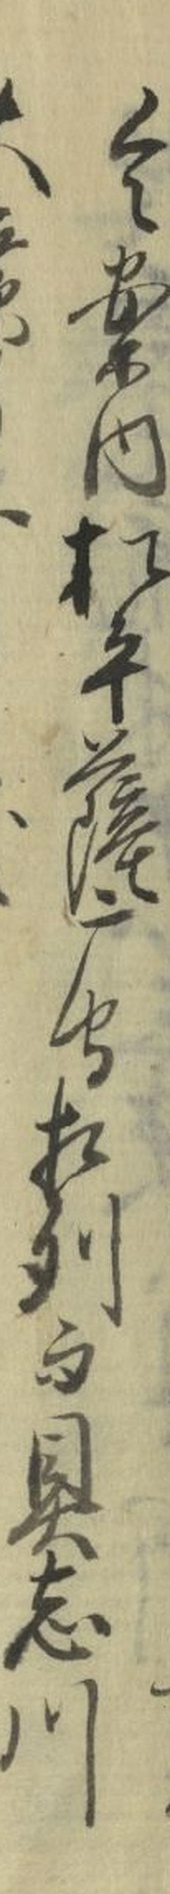令案内松平薩摩守相列而具志川
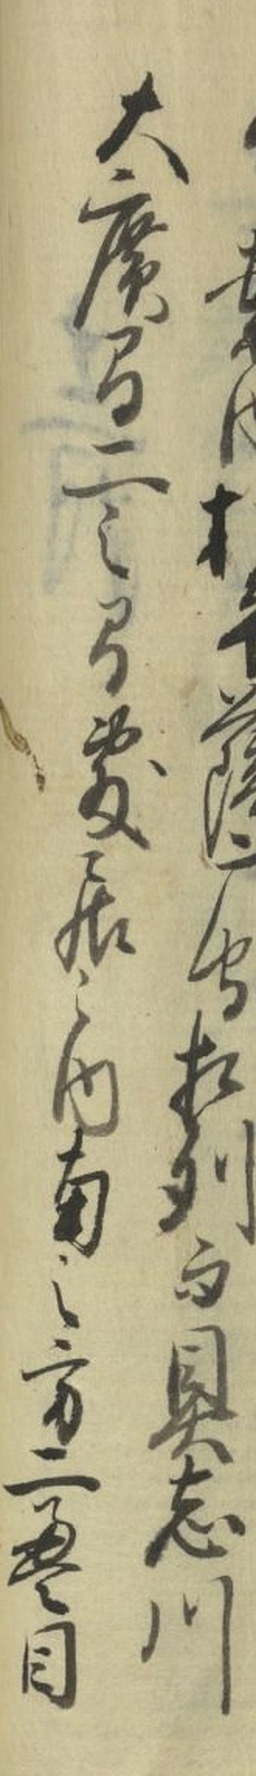大広間二之間敷居之内南之方二畳目
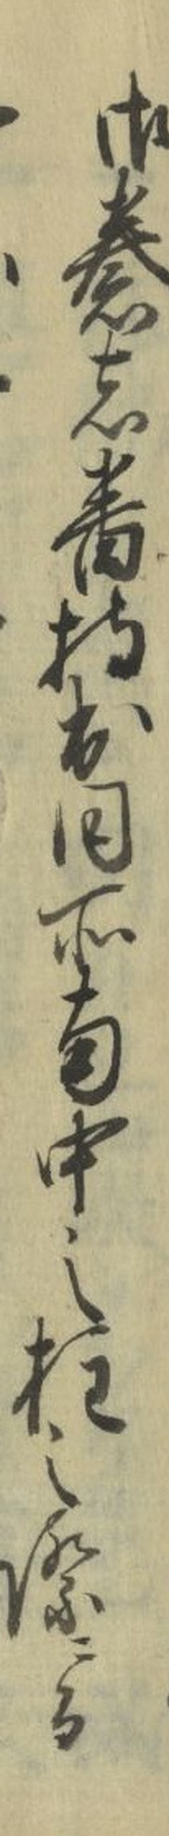御奏者番持出同所南中之柱之際にて
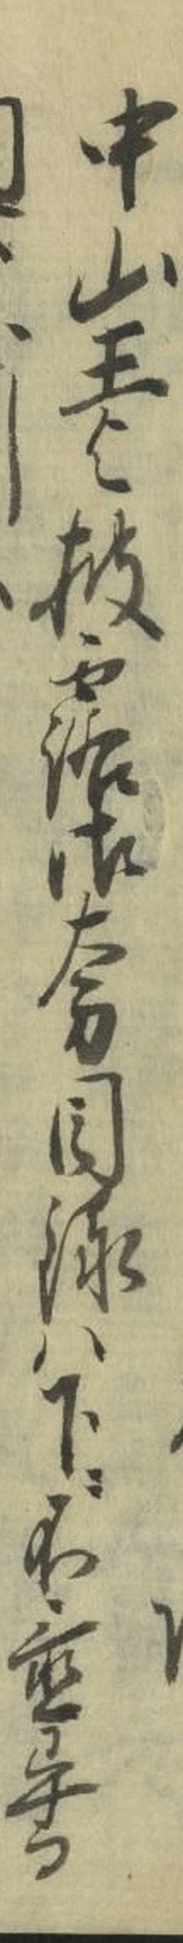中山王と披露御太刀目録は下に不置畢て
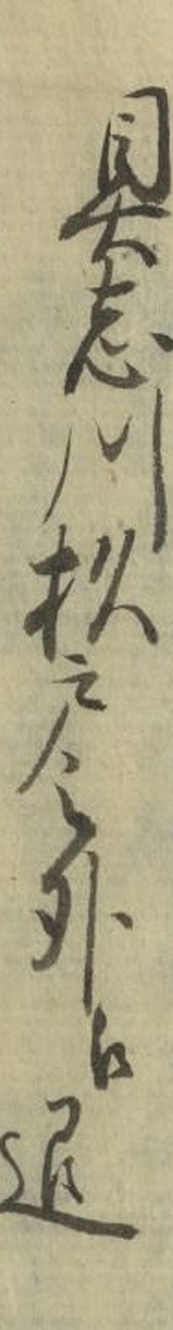具志川杉戸之外え退
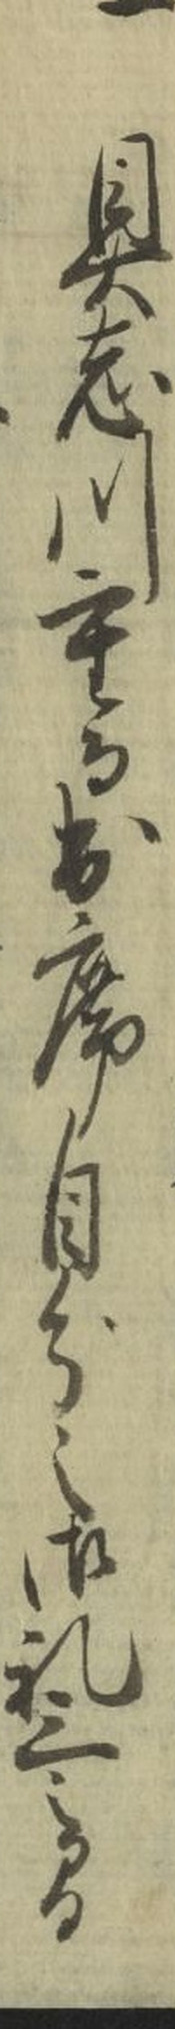一具志川重て出席自分之御礼三之間
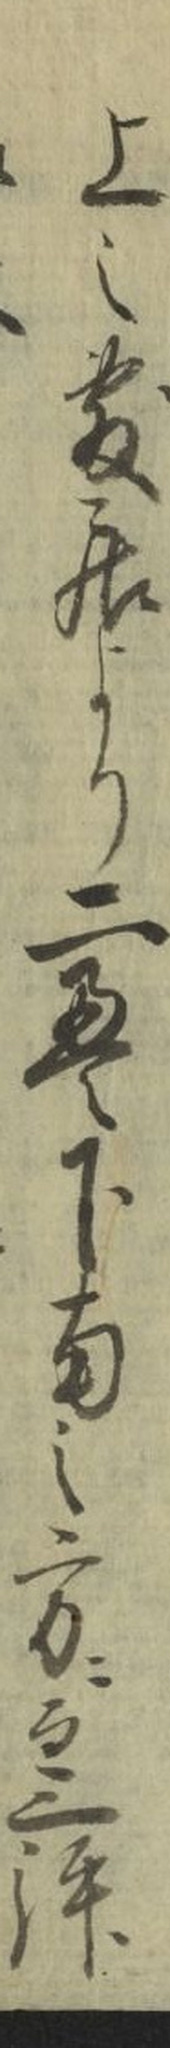上之敷居より二畳下南之方にて三拝
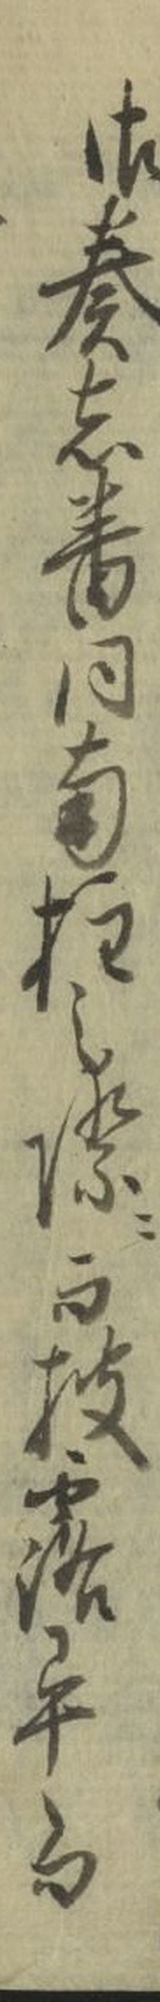御奏者番同南柱之際にて披露畢て
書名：戊辰琉球人来朝之式 全
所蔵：University of the Ryukyus Library
